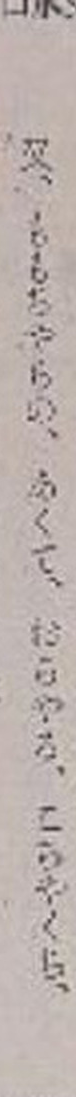又、ももちやらの、あくて、おちやる、こちやくち、
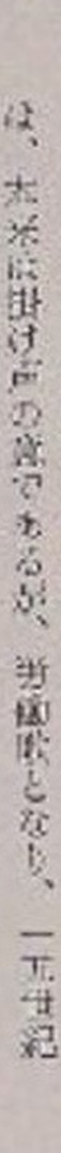は、本来は掛け声の意であるが、労働歌となり、一五世紀
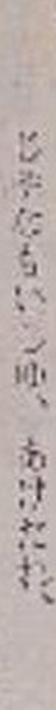じやなもいしゆ、あけたれ、
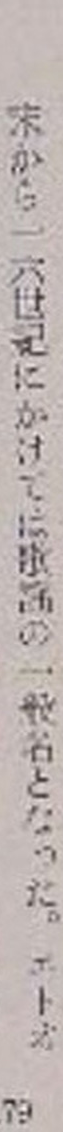末から一六世紀にかけては歌謡の一般名となった。エトオ
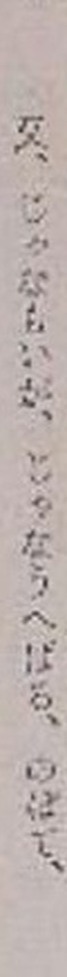又、じやなもいが、じやなうへばる、のぼて、
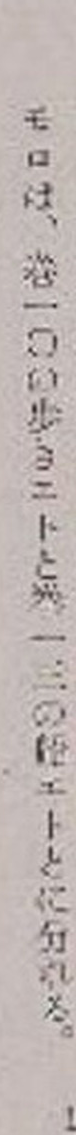モロは、巻一〇の歩きエトと巻一三のエトとに分れる。

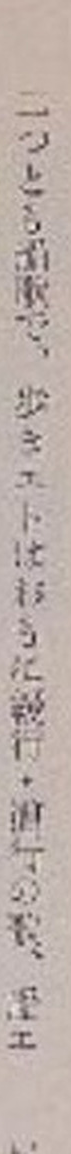二つとも船歌で、歩きエトはおもに行・行の歌、エ
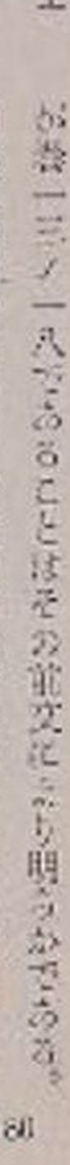が巻一三ノ一八であることはその前文により明らかである。
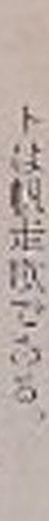トは帆走歌である。
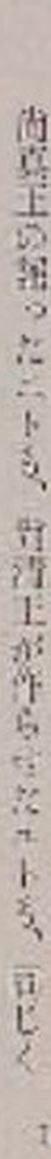尚真王の謡ったエトも、尚清王が作らせたエトも、同じく
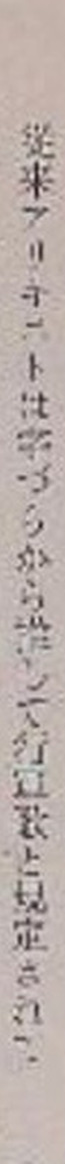従来アリキエトは字づらから推して行歌と規定されて
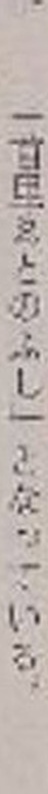「首里ゑとのふし」となっている。
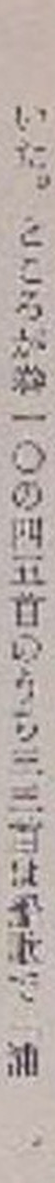いた。ところが巻一〇の四五首のうち三三首は船歌で「浦
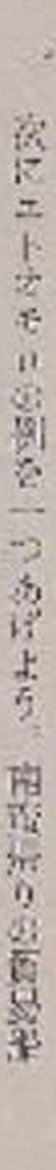次にエトオモロの例を一つあげよう。南蛮帰りの貿易船
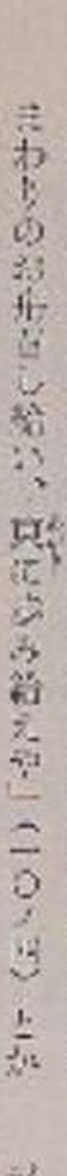まわりのお舟召し給い、東に歩み給えや」(一〇ノ四)とか
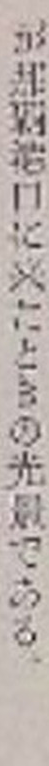が那覇港口に来たときの光景である。
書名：沖縄口承文芸
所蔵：University of the Ryukyus Library
